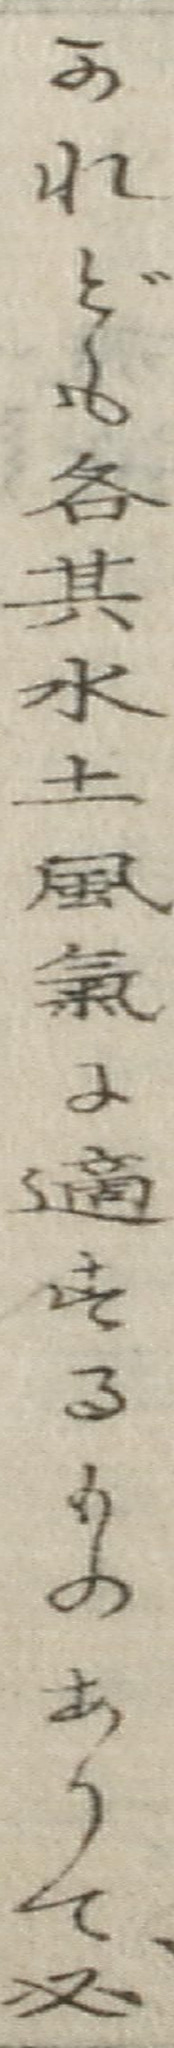かれども各其水土風気に適するものありて、必
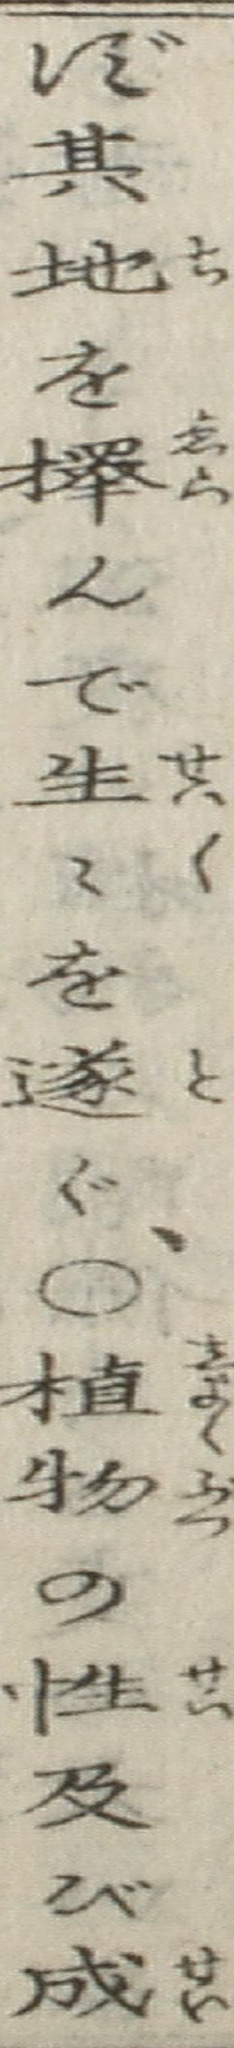ず其地を択んで生々を遂ぐ、○植物の性及び成
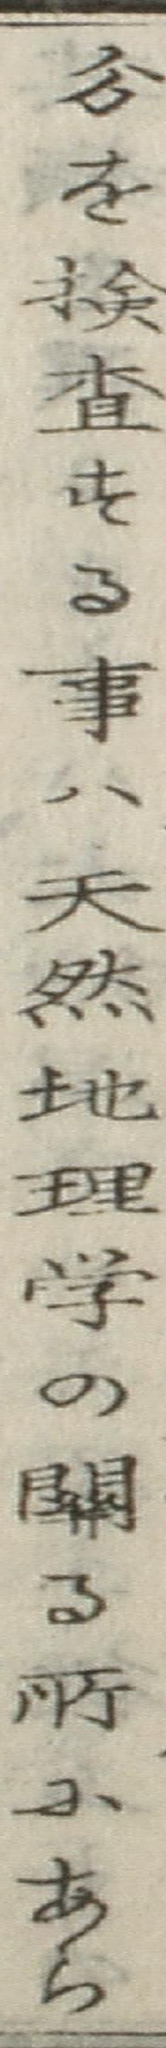分を検査する事は、天然地理学の関る所にあら
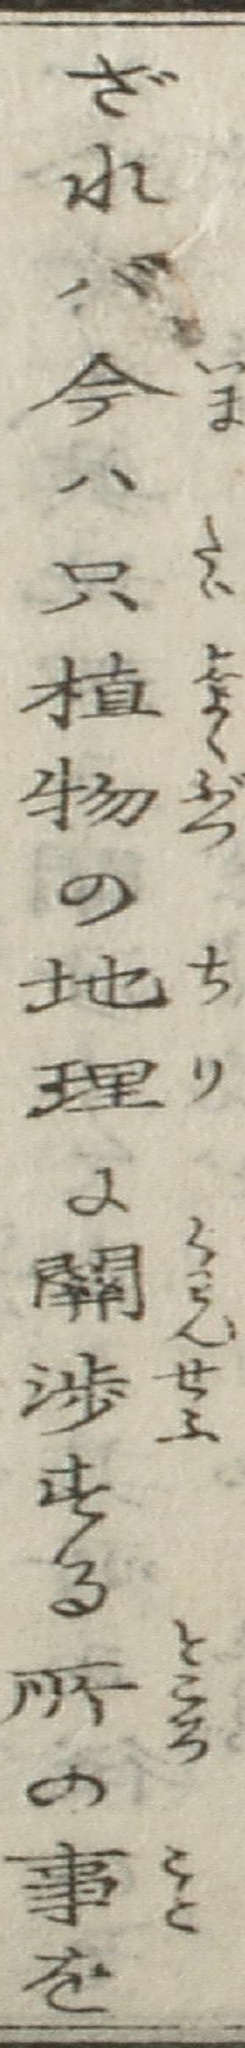ざれば、今は只植物の地理に関渉する所の事を
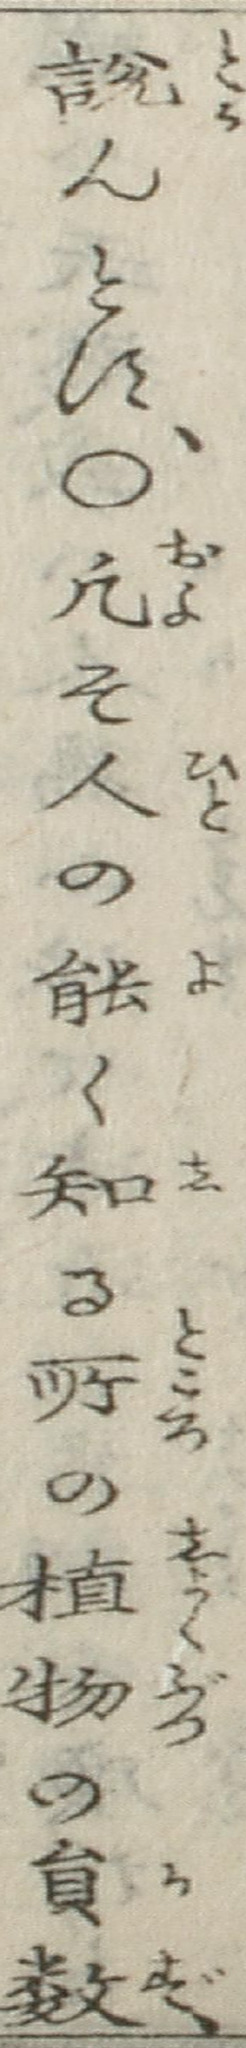説んとす、○凡そ人の能く知る所の植物の員数、
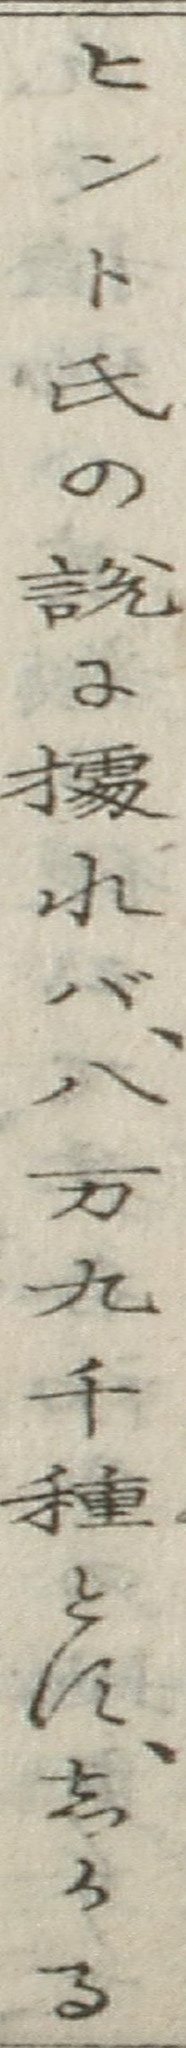ヒント氏の説に拠れば、八万九千種とす、しかる
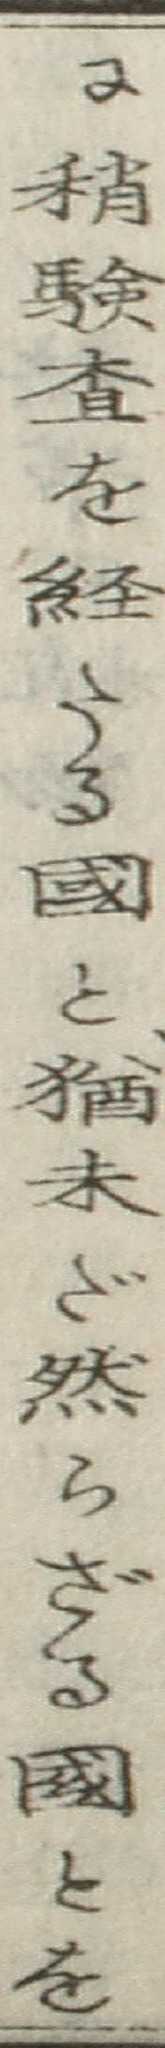に稍験査を経たる国と、猶未だ然らざる国とを
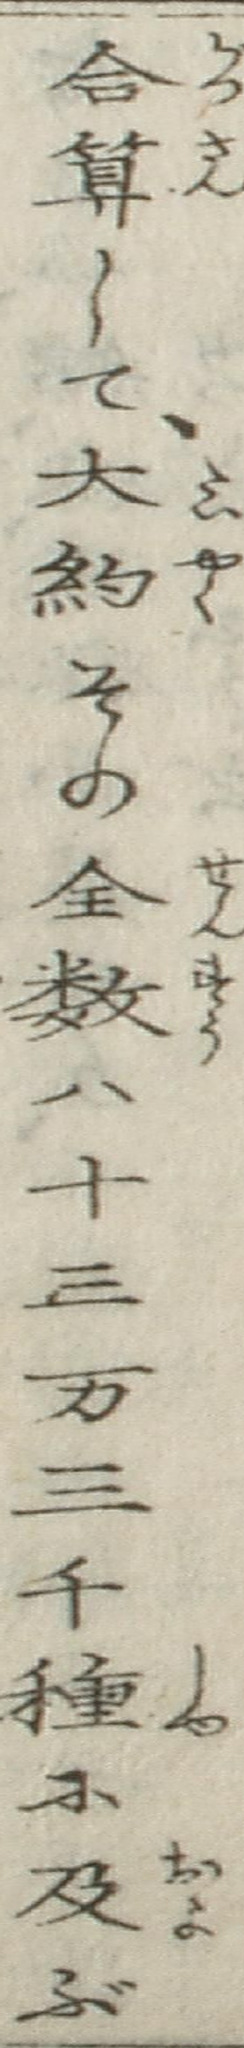合算して、大約その全数は十三万三千種に及ぶ
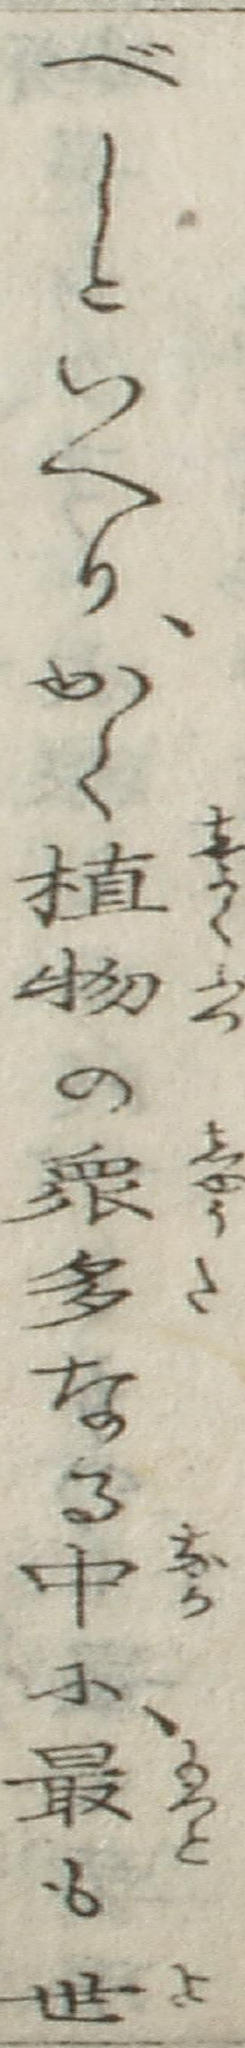べしといへり、かく植物の衆多なる中に、最も世
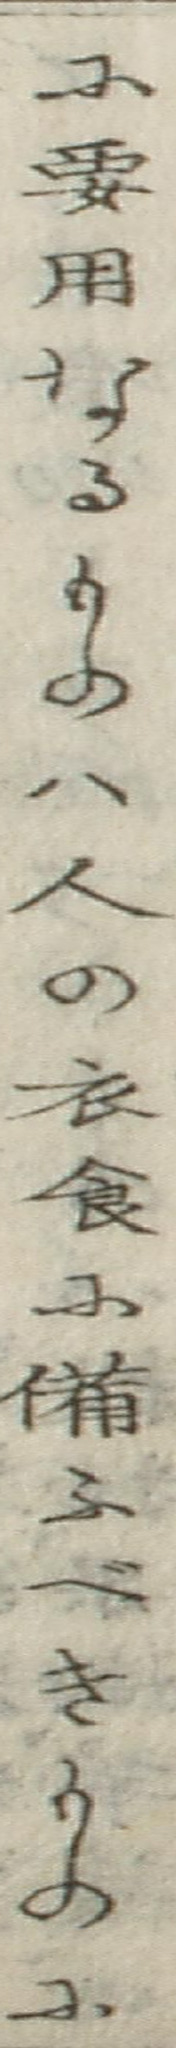に要用なるものは人の衣食に備ふべきものに

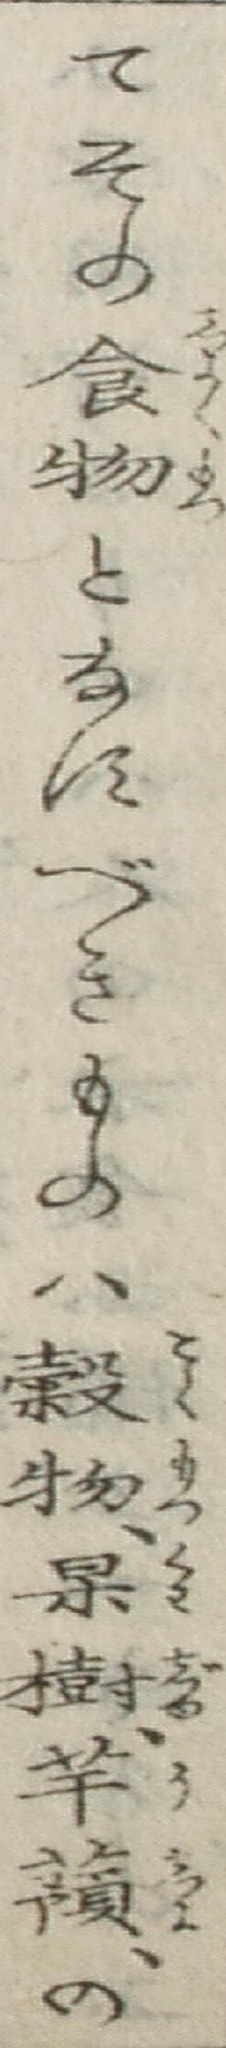てその食物となすべきものは穀物、果樹、芋蕷、の
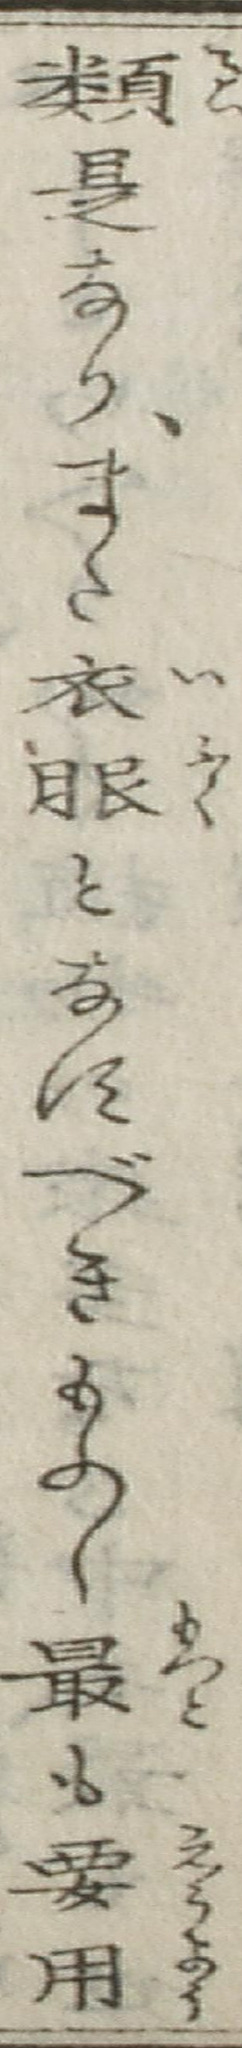類是なり、また衣服となすべきもの最も要用
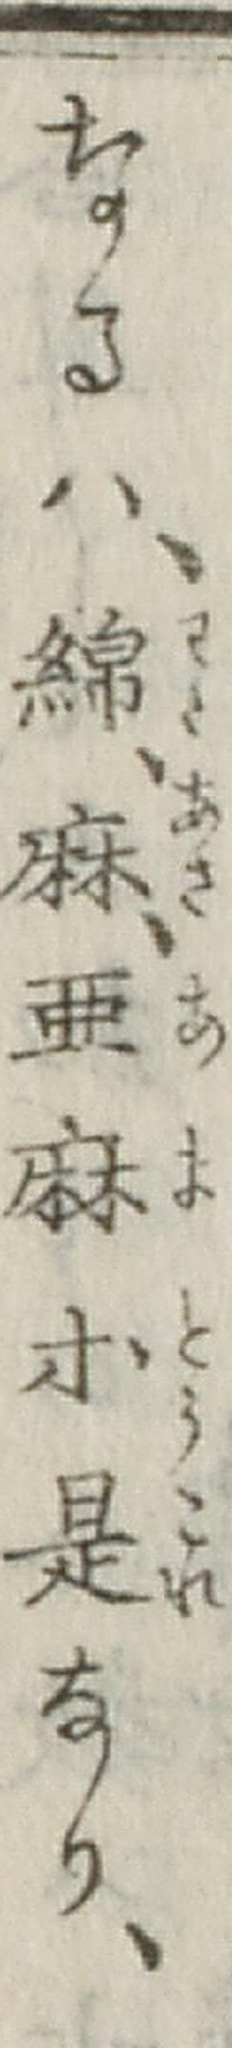なるは、綿、麻、亜麻等是なり、
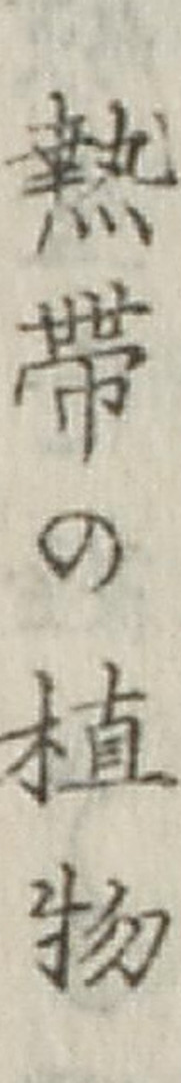熱帯の植物
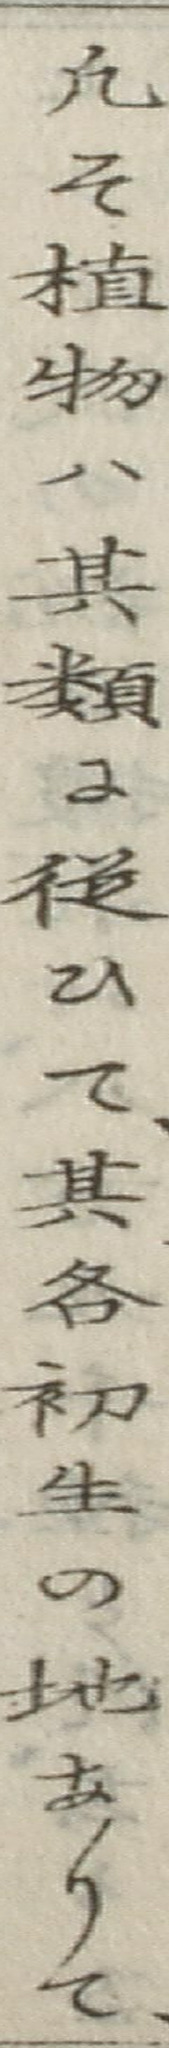凡そ植物は其類に従ひて、其各初生の地ありて、
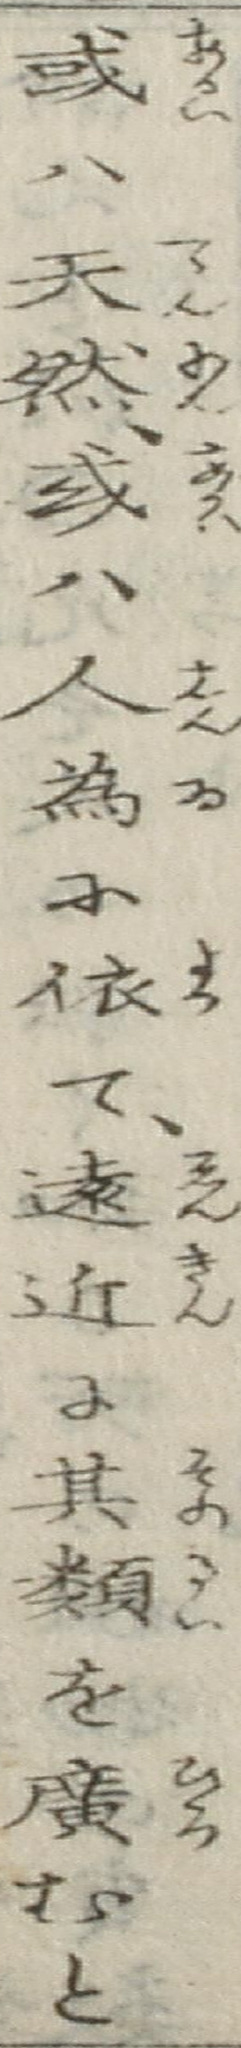或は天然、或は人為に依て、遠近に其類を広むと
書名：訓蒙　天然地理學　下
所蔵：東京大学地震研究所図書室 Earthquake Research Institute Library, The University of Tokyo, JAPAN
